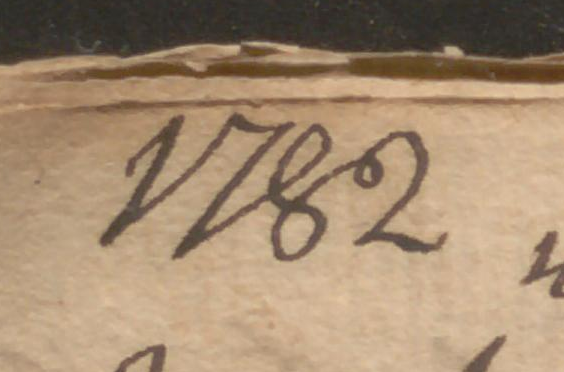1782
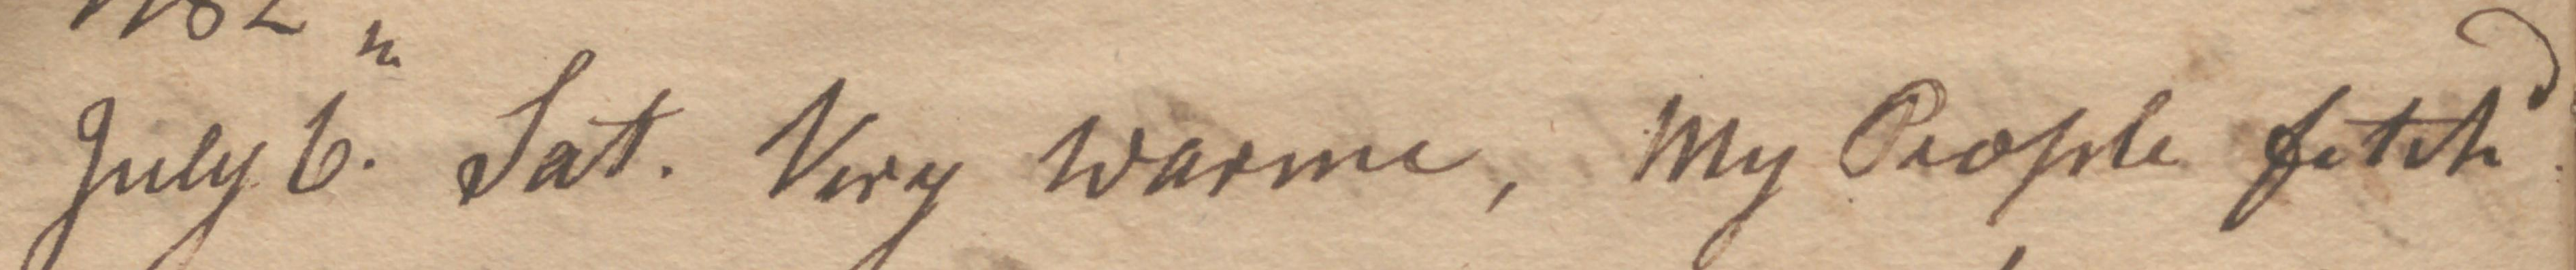July 6. Sat. Very warme, My People fetch^d
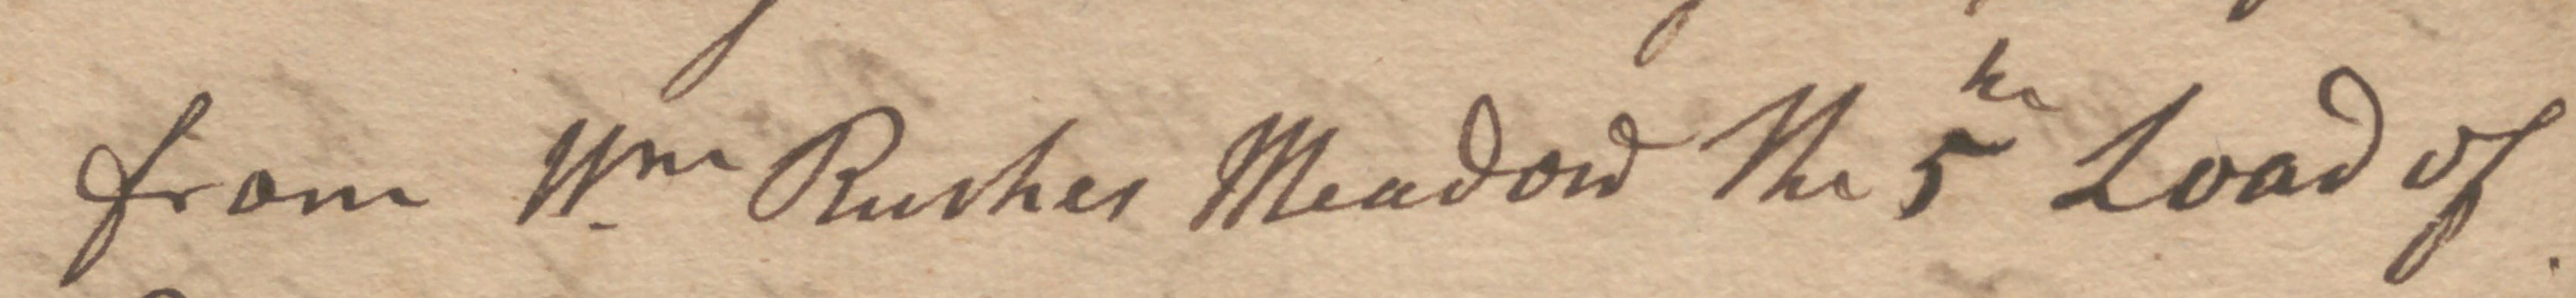from W^m. Rushes Meadow the 5^th Load of
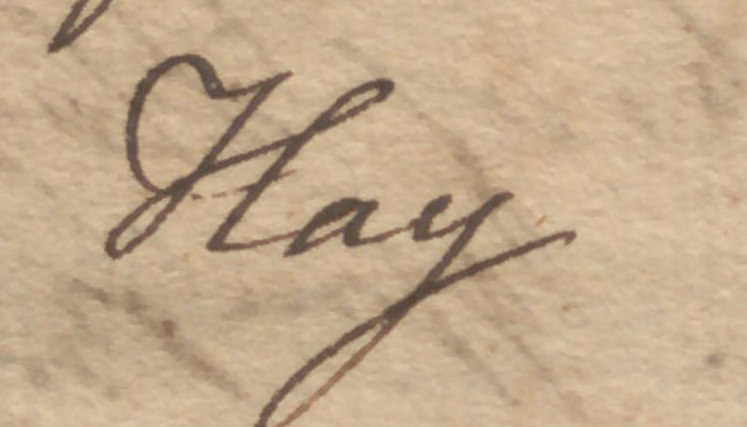Hay
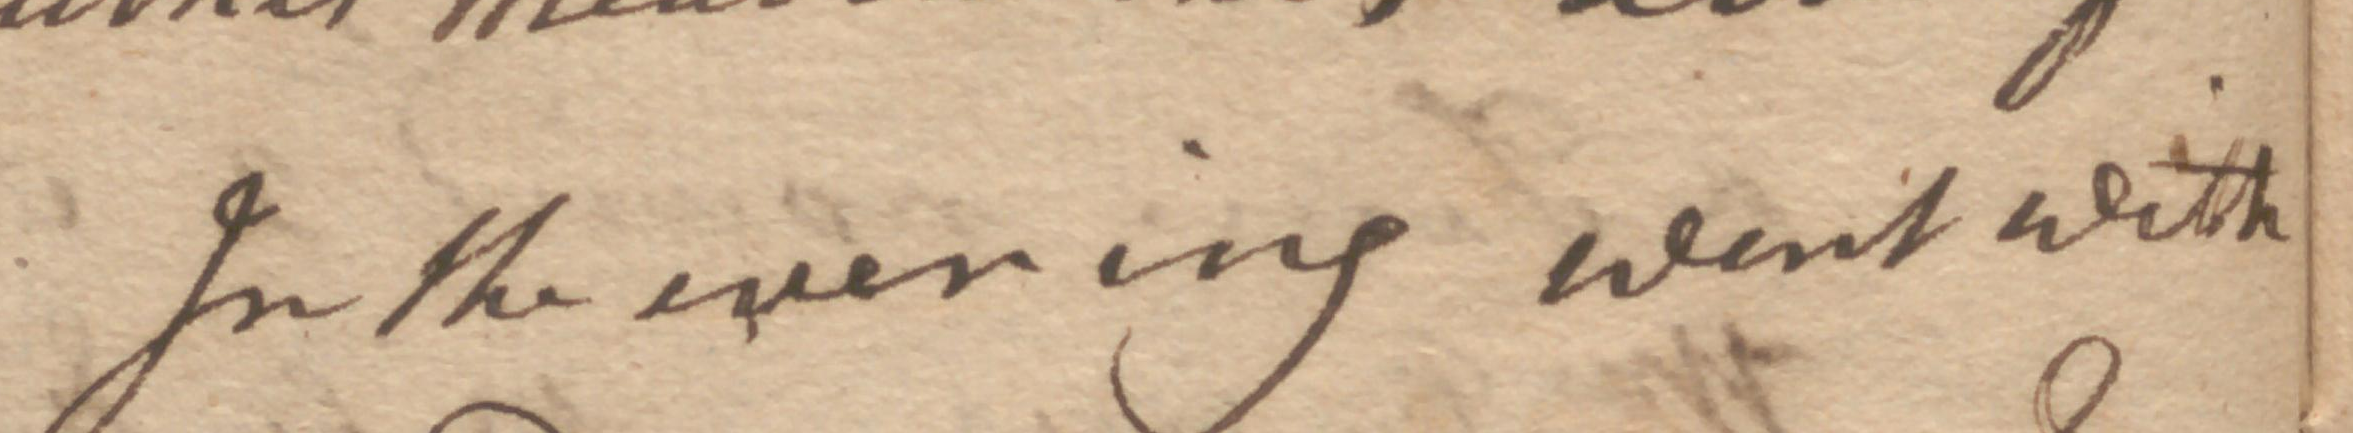In the evening went with
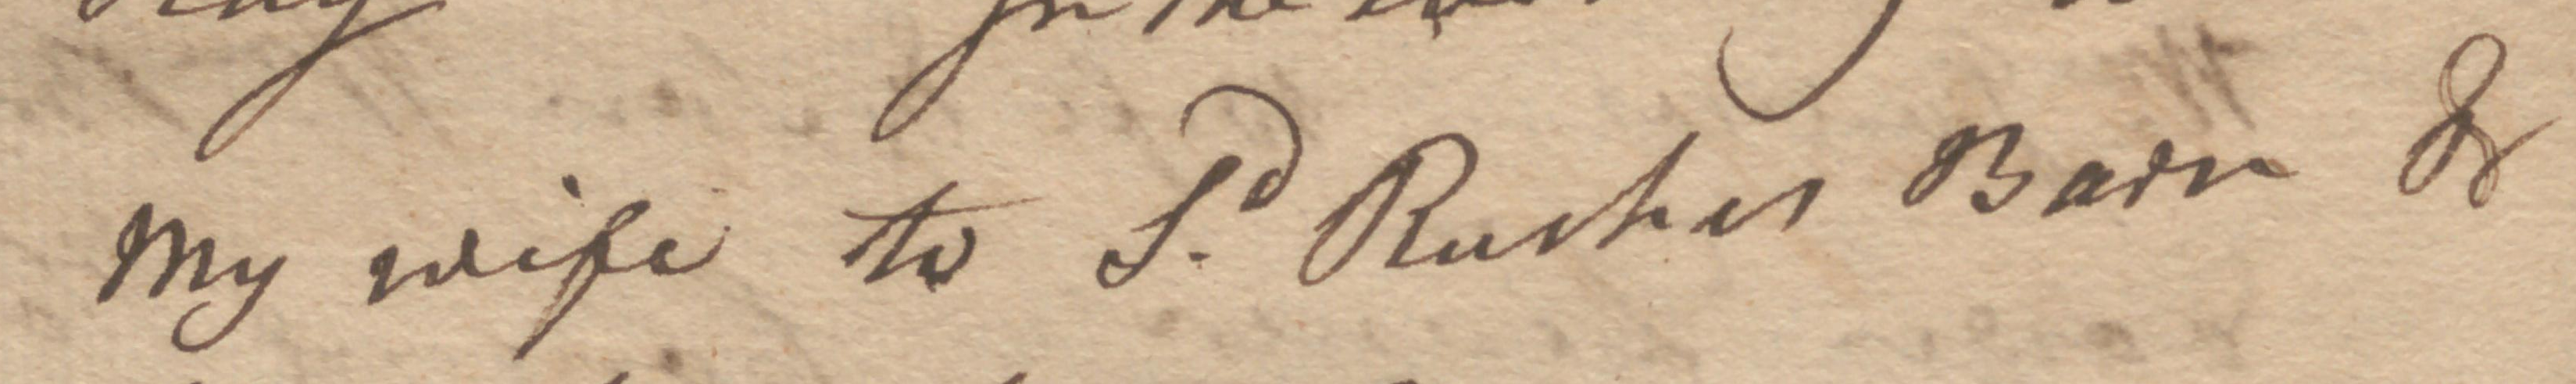my wife to s^d. Rushes Barn &
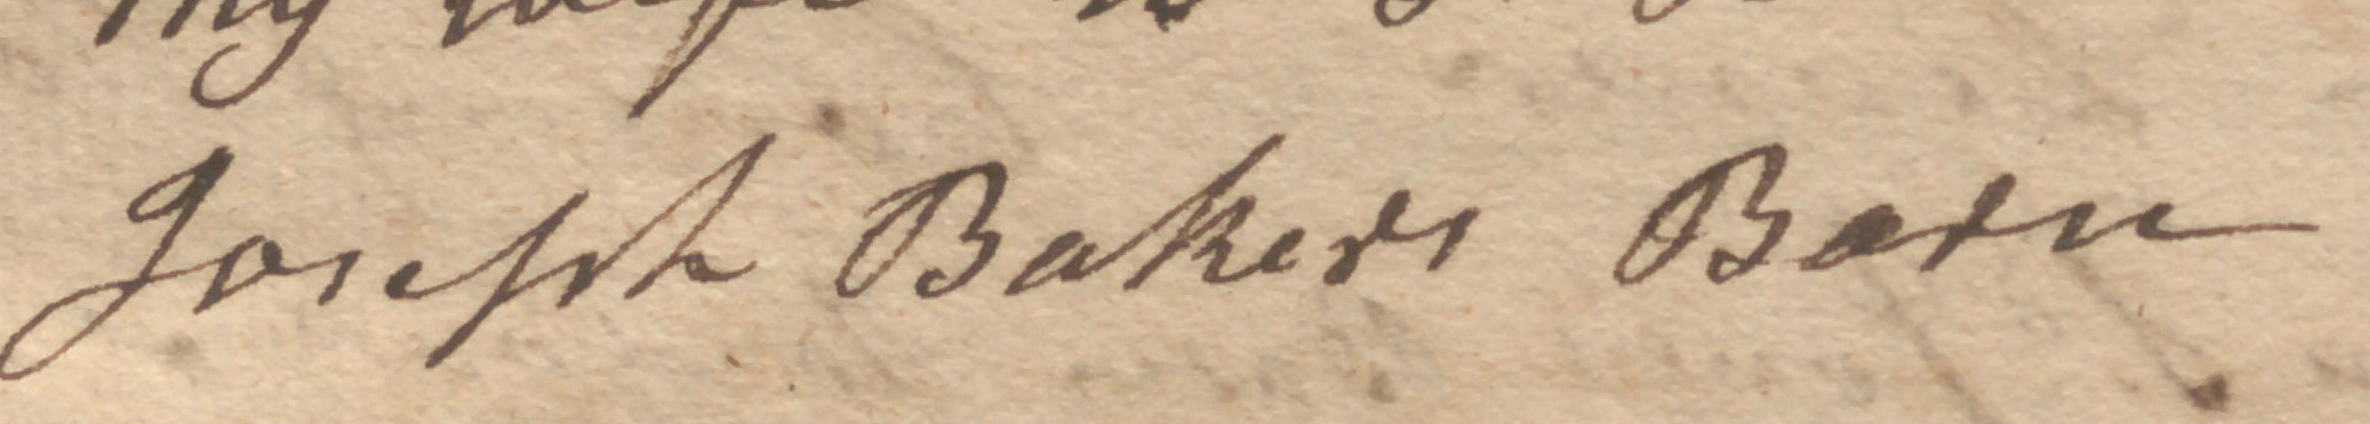Joseph Bakers Barn
